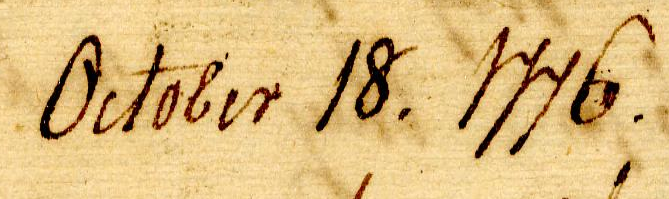October 18. 1776.
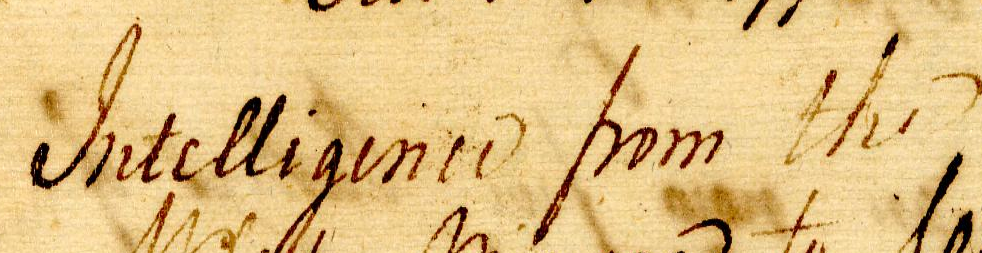Intelligence from the
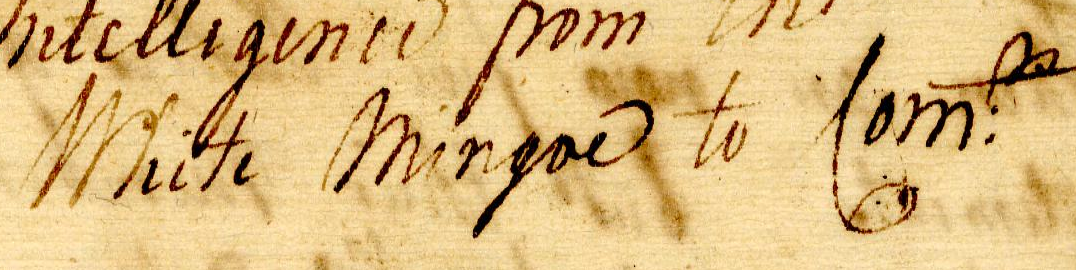White Mingoe to Com^r.
